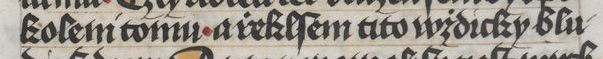koleni tomu.a ṙeklſem tito wżdicky blu¬
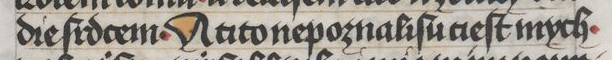die ſrdcem.A tito nepoznaliſu cieſt mych.
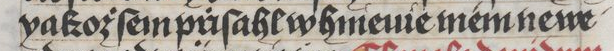yakoż ſem pṙiſahl whnieuie mem newe¬
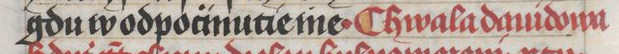gdu w odpoċinutie me.Chwala dauidowa
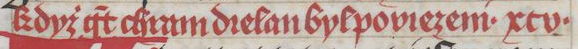kdyż ḡt chram dielan byl poviezeni.xcv.
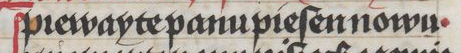ſpiewayte panu pieſen nowu.
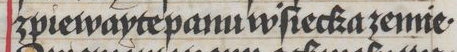zpiewayte panu wẛiecka zemie.
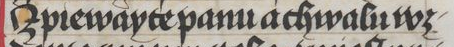Zpiewayte panu a chwalu wz¬
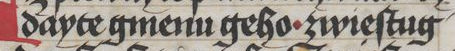dayte gmenu geho.zwieſtug¬
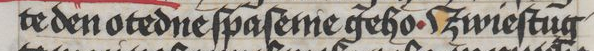te den otedne ſpaſenie geho.Zwieſtug¬
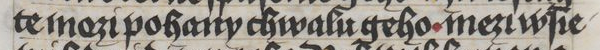te mezi pohany chwalu geho.mezi wẛie¬
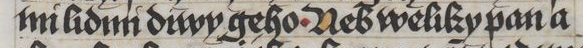mi lidmi diwy geho.Neb weliky pan a
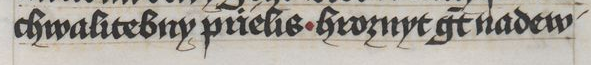chwalitebny pṙieliṡ.hroznyt ḡt nadew¬
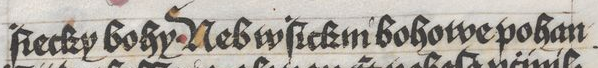ẛiecky bohy.Neb wẛickni bohowe pohan¬
